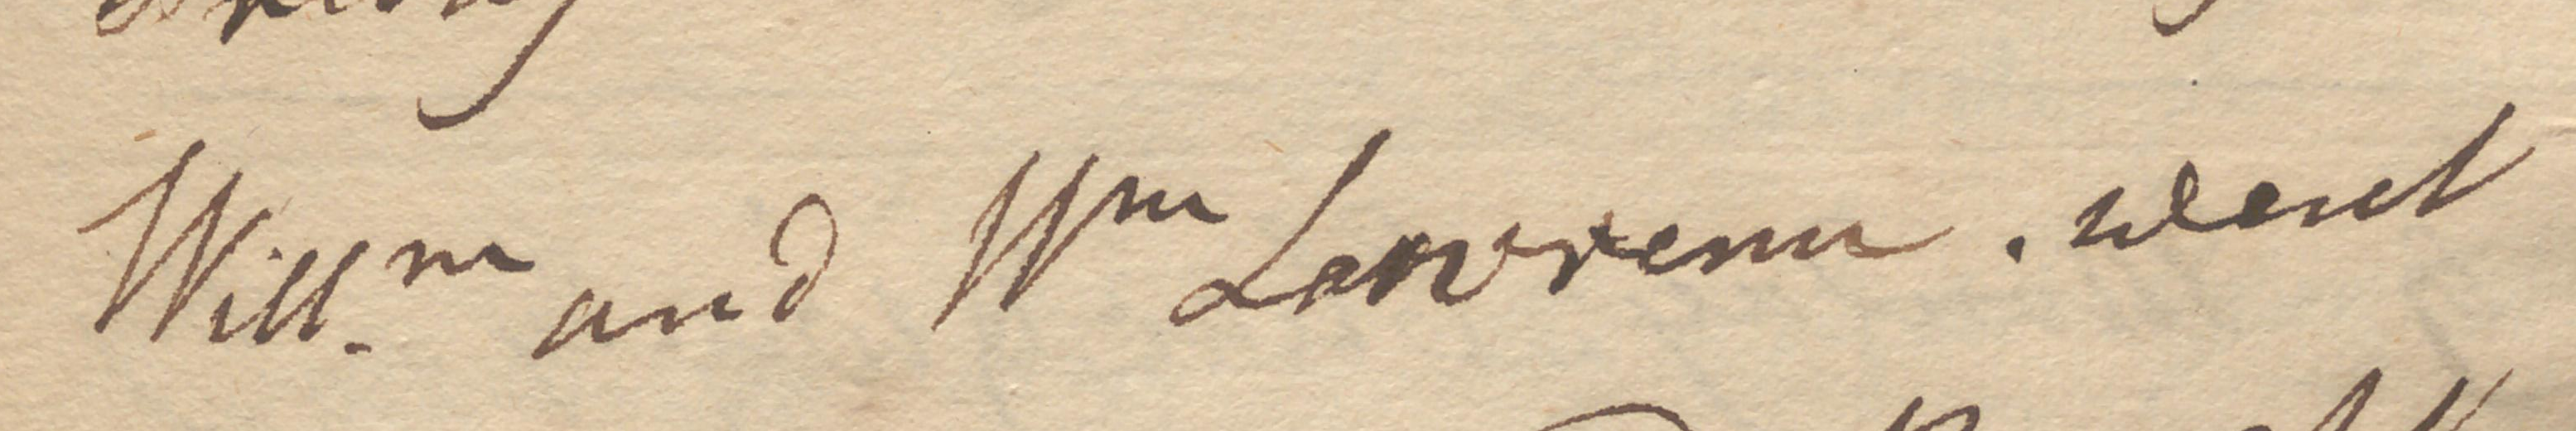Will^m. and W^m Lawrence went
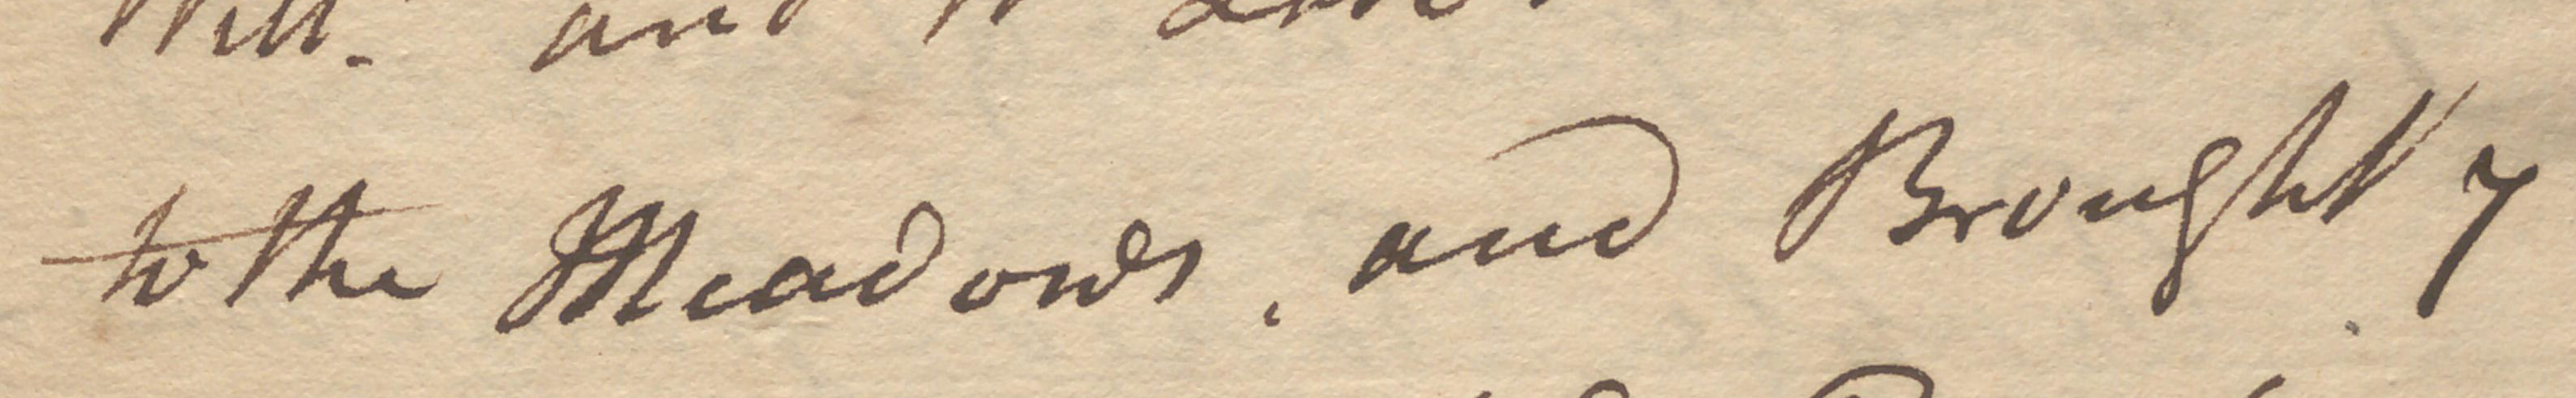to the Meadows and Brought 7
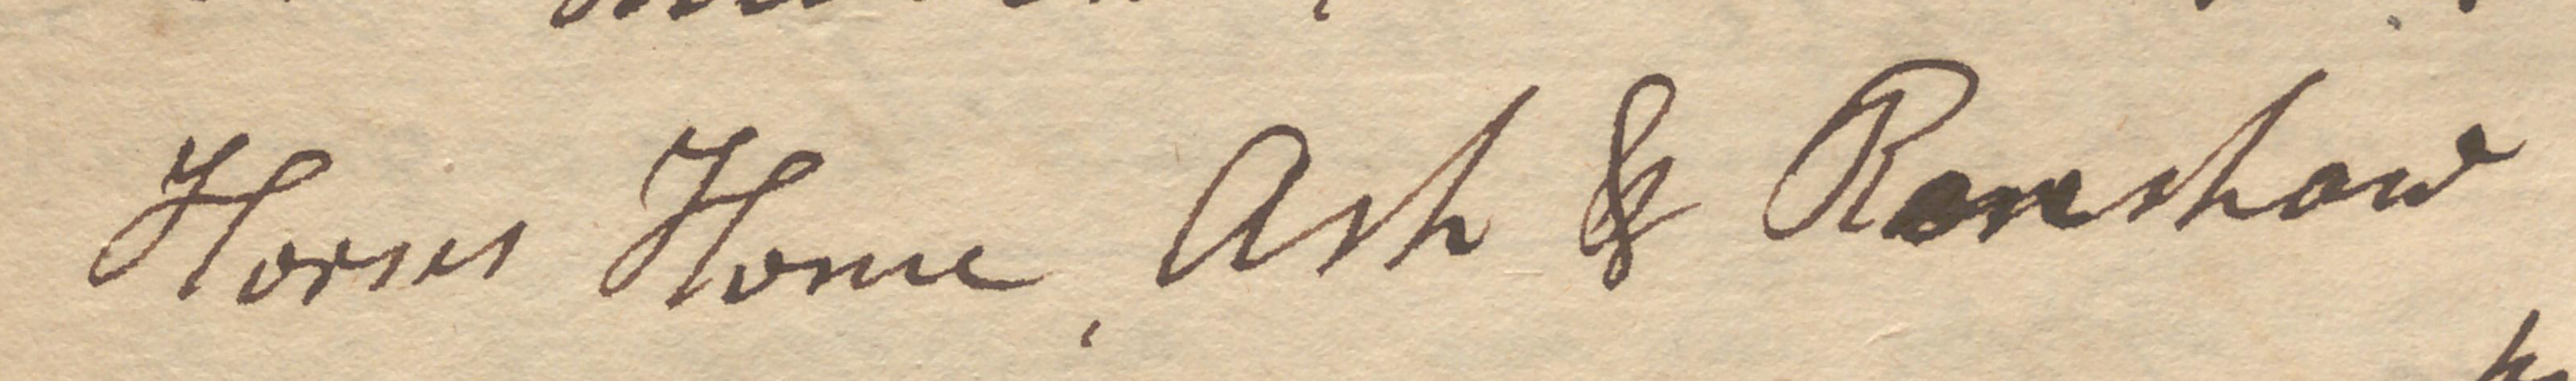Horses Home Ash & Ranshaw
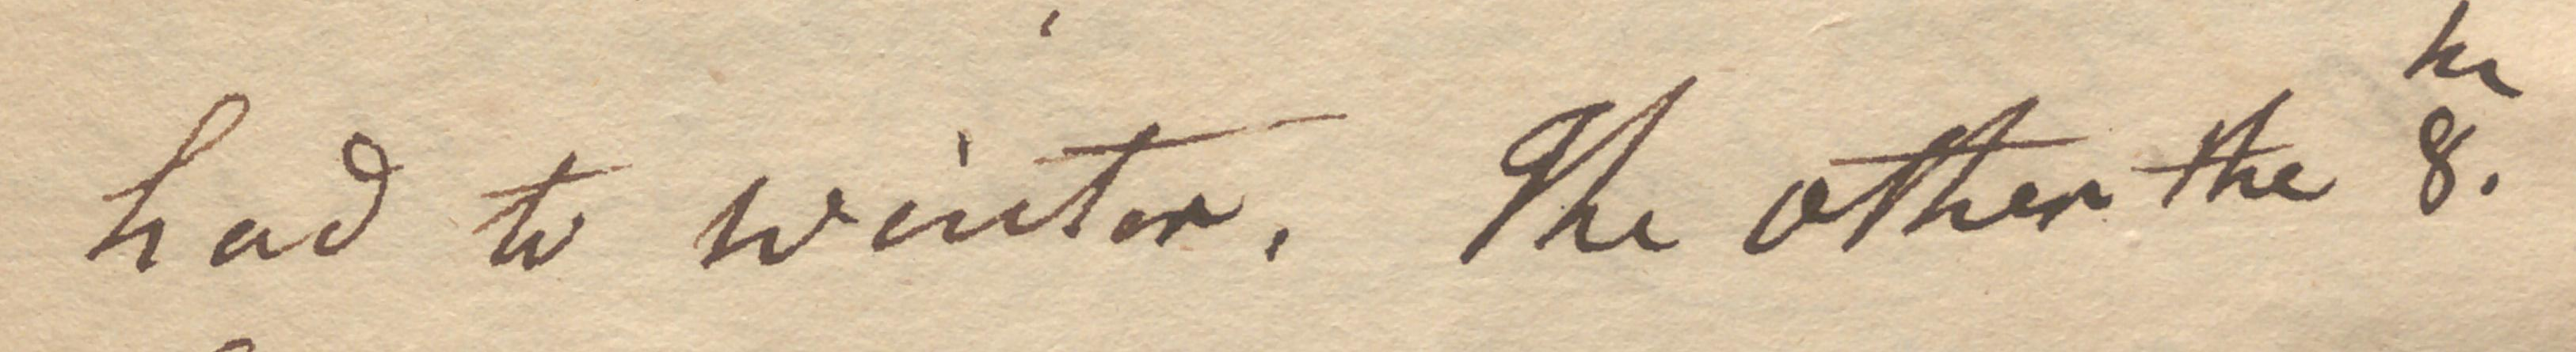had to winter. The other the 8^th.
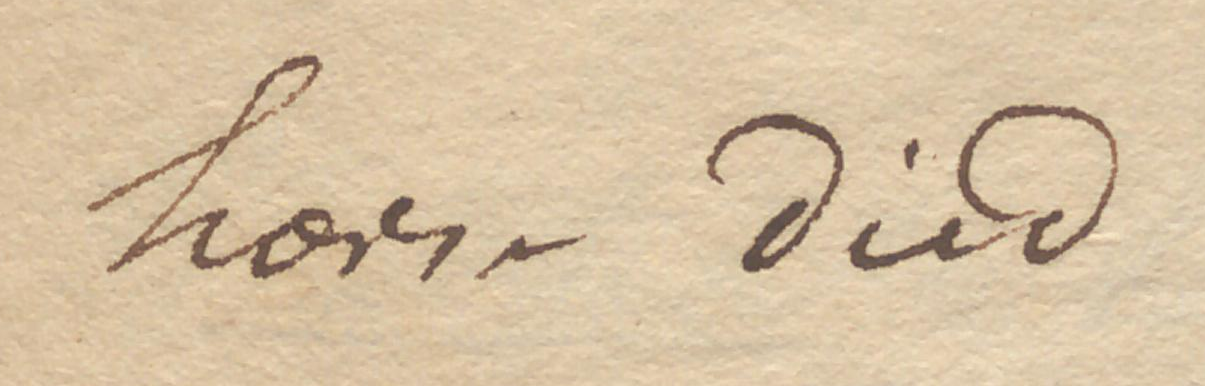horse died
